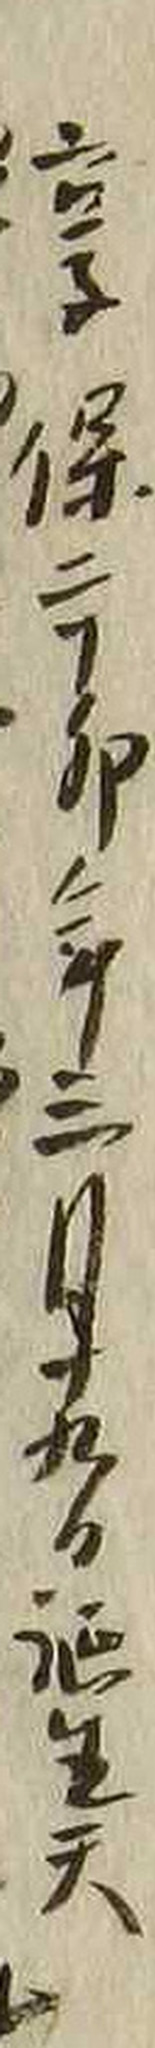享保二十卯年三月十九日誕生天
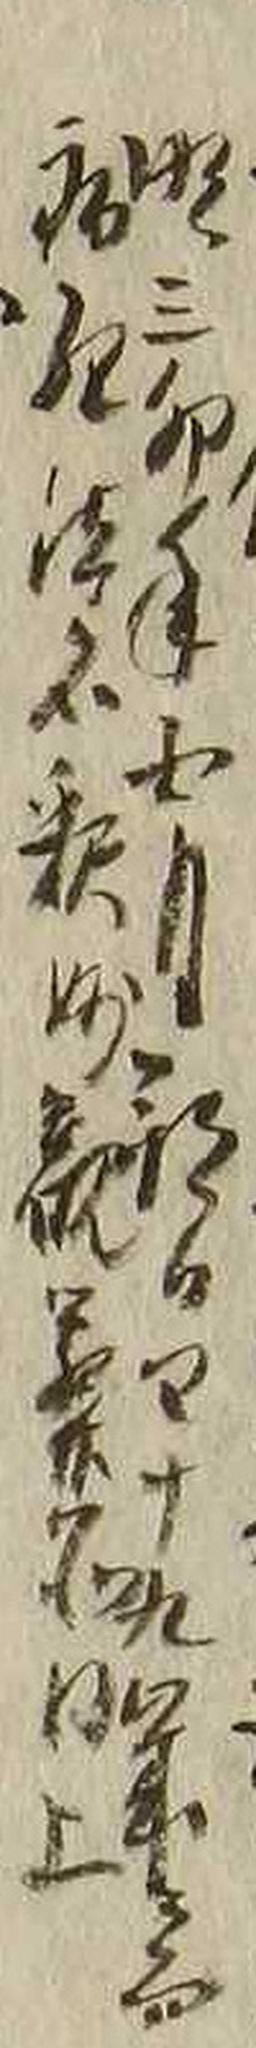病死法名釋妙観葬所同上
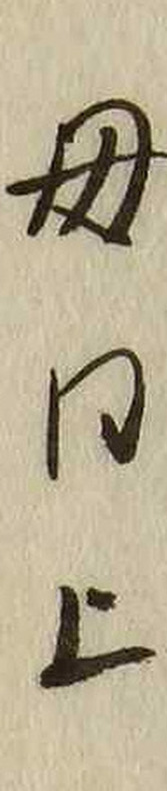母同上
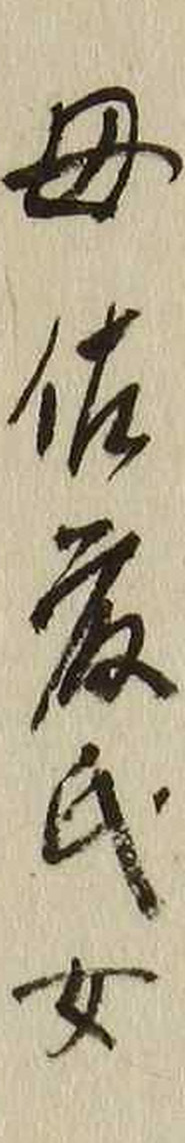母佐藤氏女
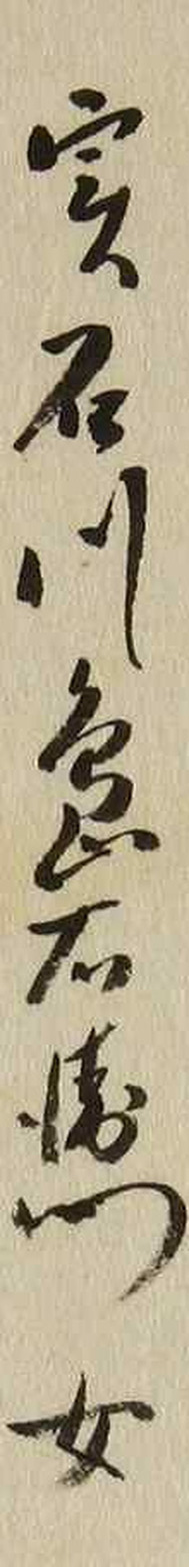実石川島右衛門女
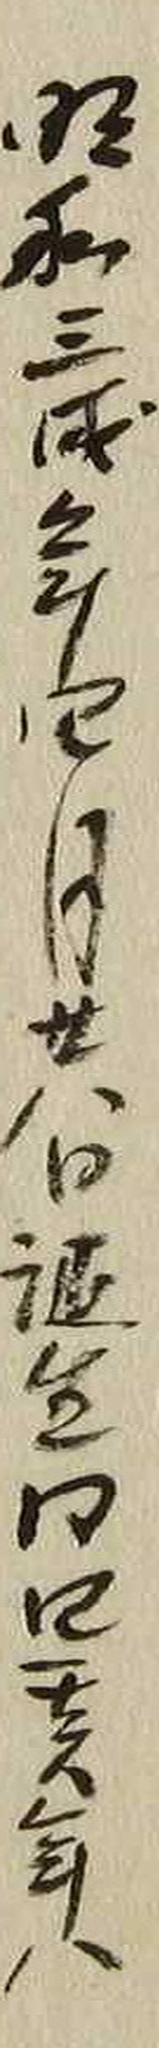明和三戌年四月廿八日誕生同四亥年八
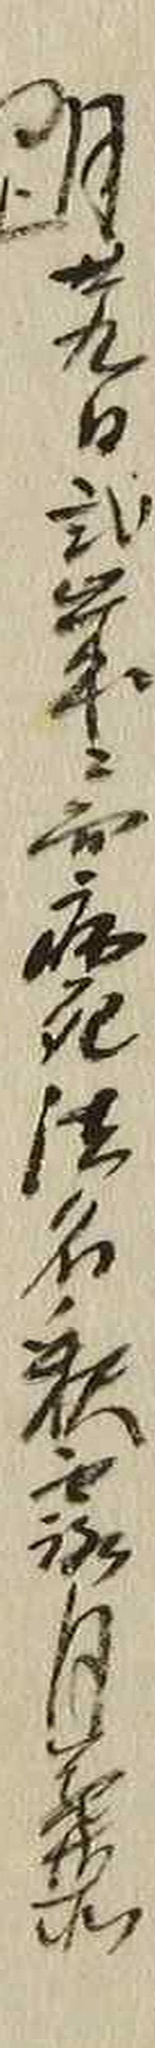弥一郎月廿九日弐歳ニ而病死法名釋霧月葬所
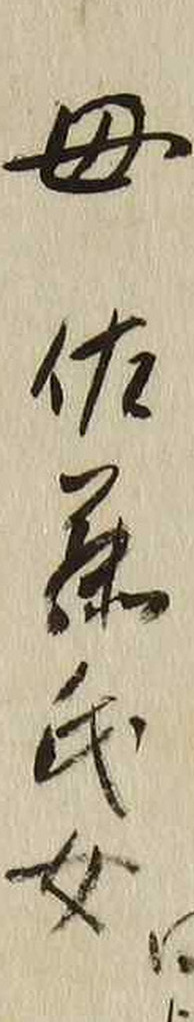母佐藤氏女
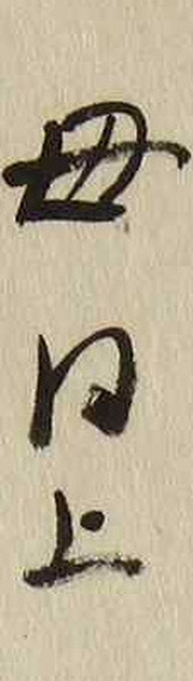母同上
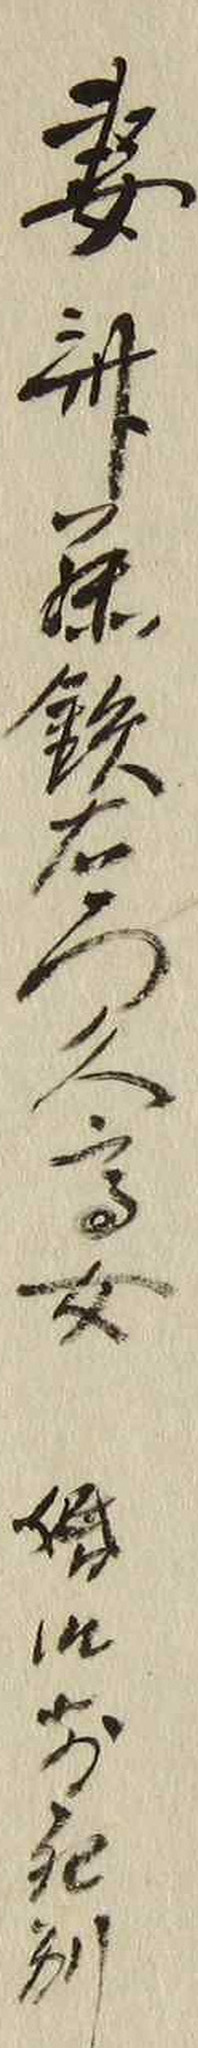妻斉藤鉄右衛門久高女婚以前死別
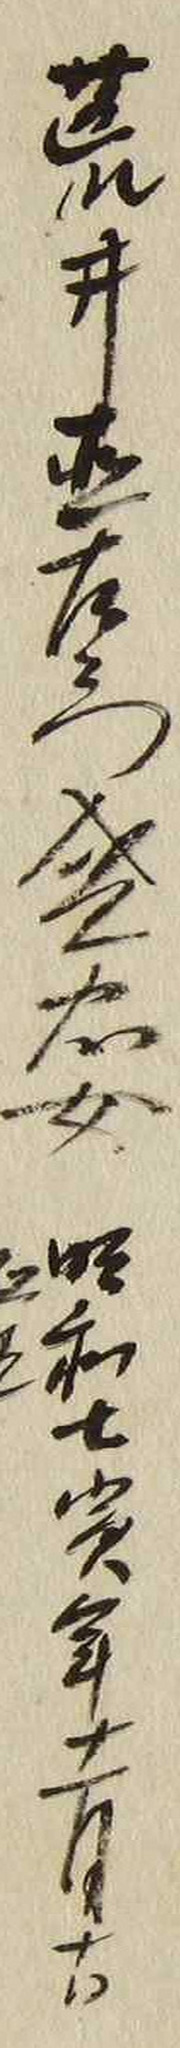荒井直左衛門盛忠女明和七寅年十一月十日誕生
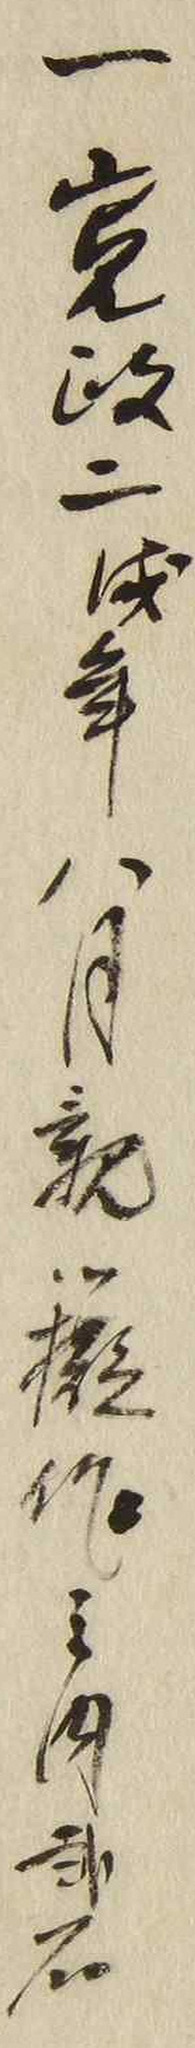一寛政二戌年八月親御擬作之内弐石

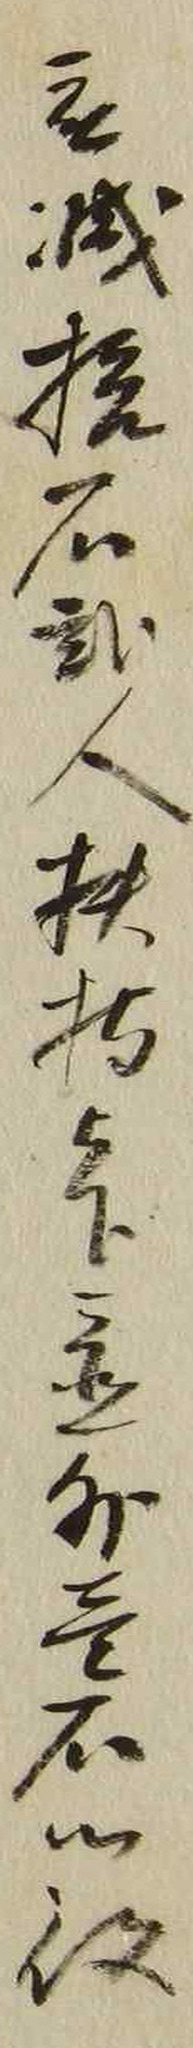被減拾石弐人扶持被下置外壱石御役
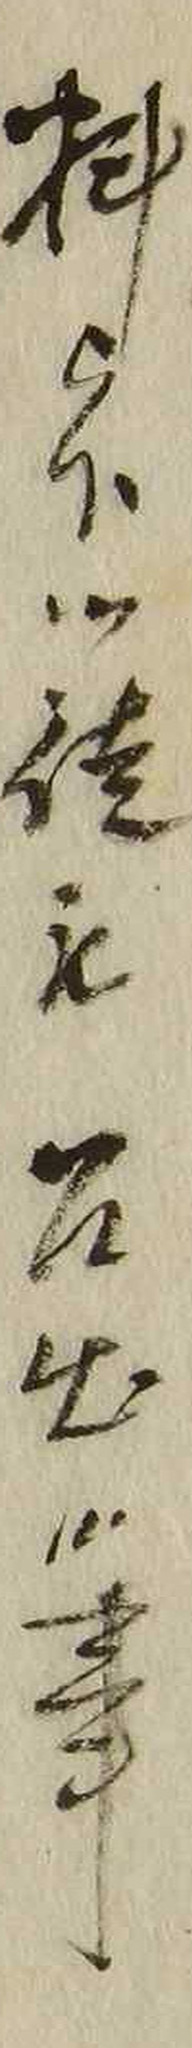料被下御徒被召出候事
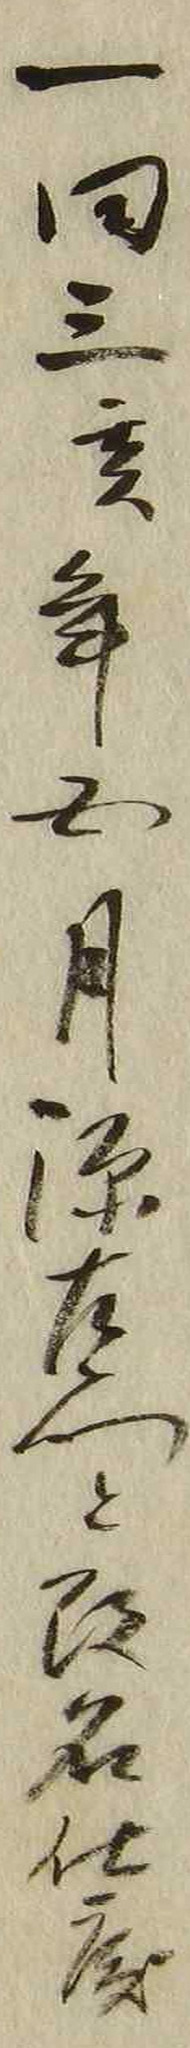一同三亥年五月源左衛門と改名仕度
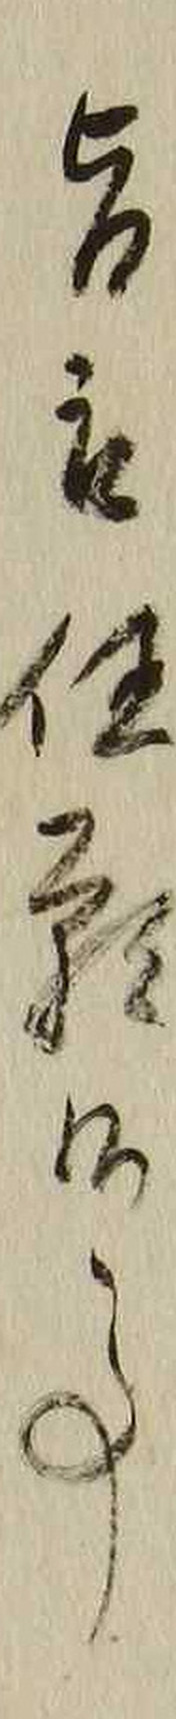旨被任願候事
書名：諸士系譜　巻之360　す之部10
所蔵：会津若松市立会津図書館
